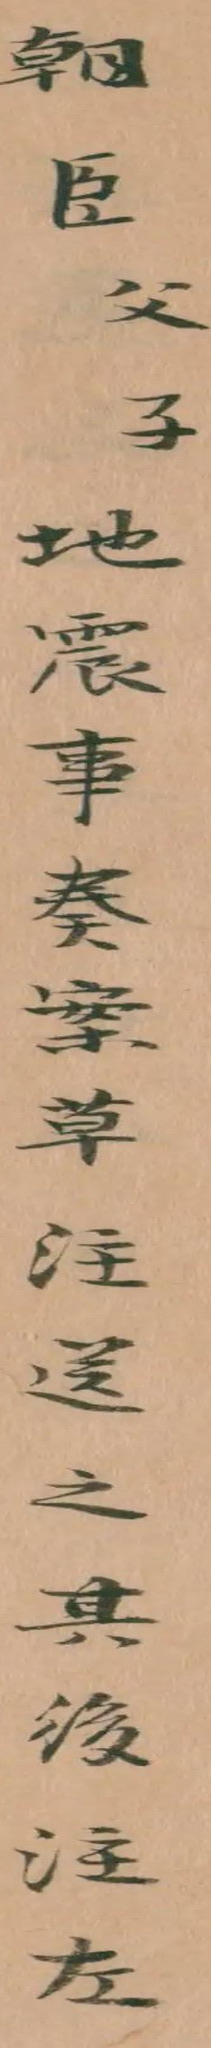朝臣父子地震事奏案草注送之其後注左
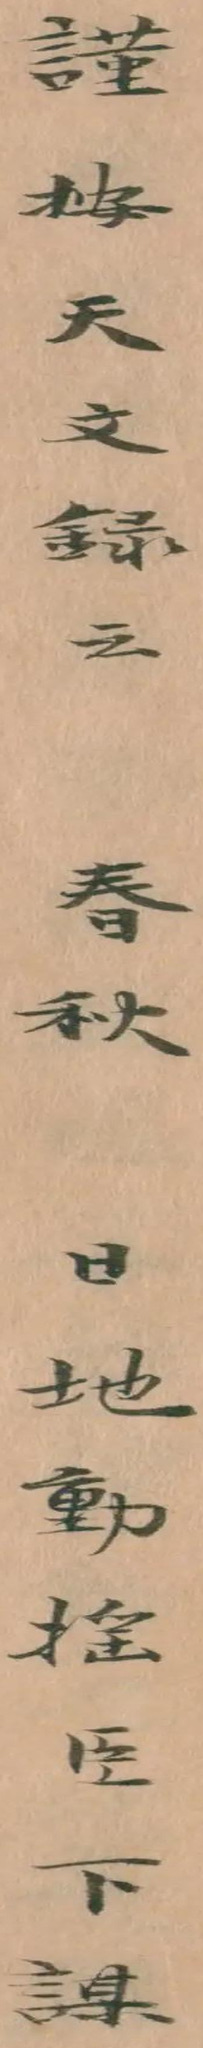謹按天文録云春秋日地動揺臣下謀
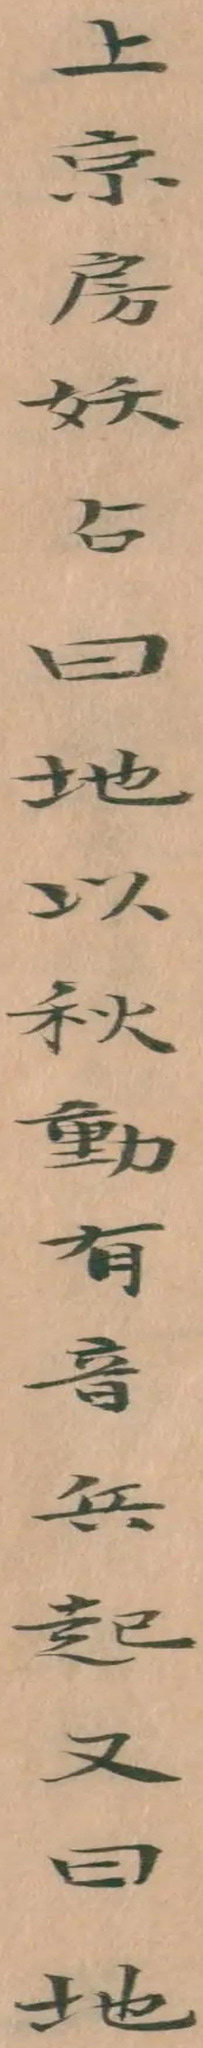上京房妖占曰地以秋動有音兵起又曰地
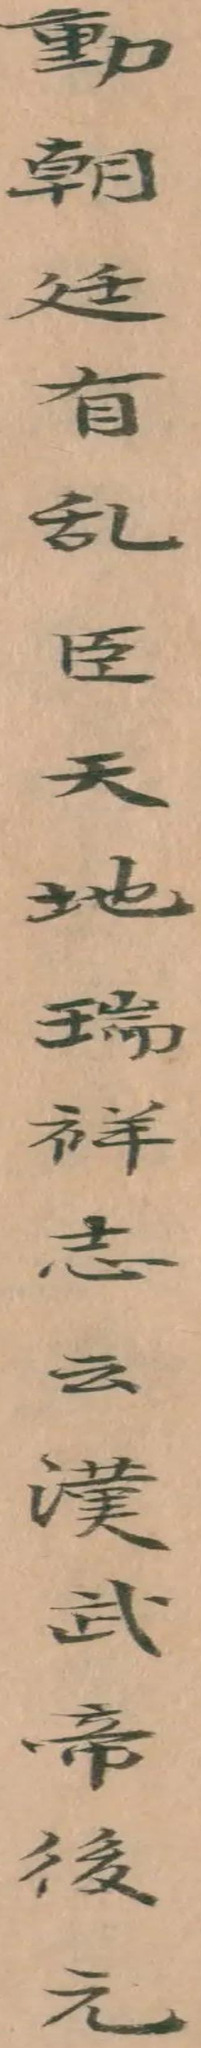動朝廷有乱臣天地瑞祥志云漢武帝後元
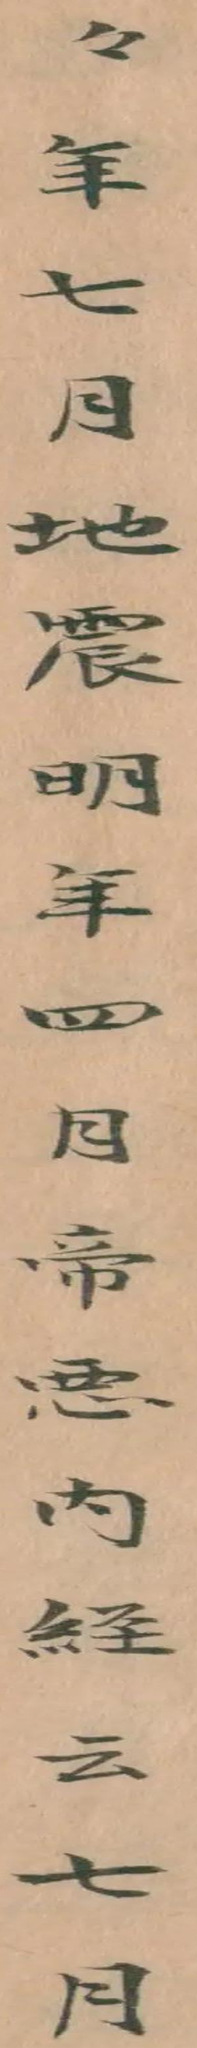々年七月地震明年四月帝悪内経云七月

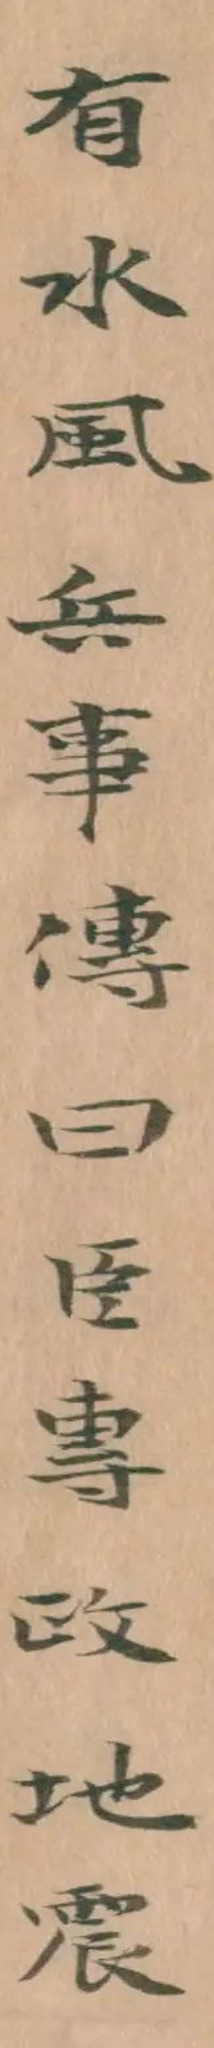有水風兵事伝曰臣専政地震
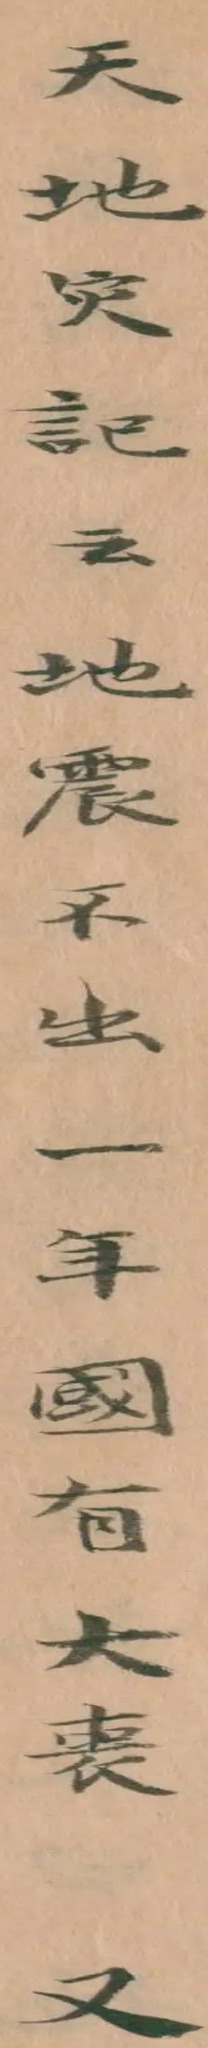天地災記云地震不出一年国有大喪又
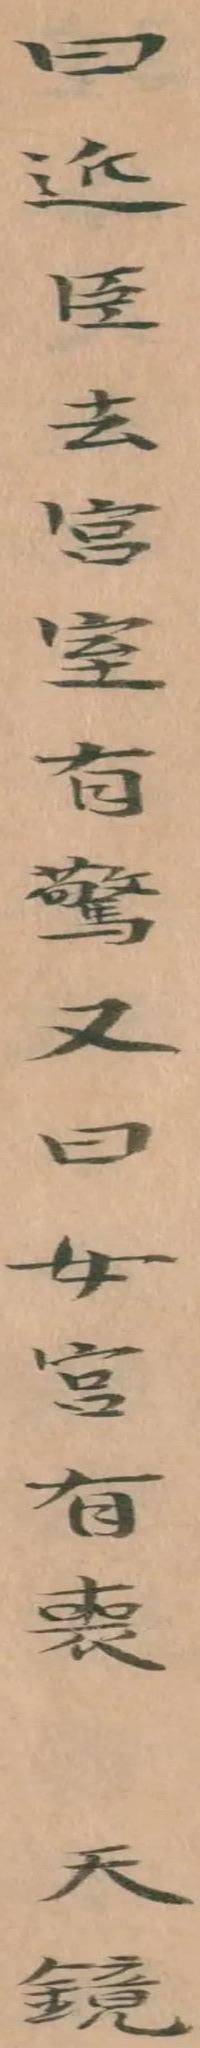曰近臣去宮室有驚又曰女宮有喪天鏡
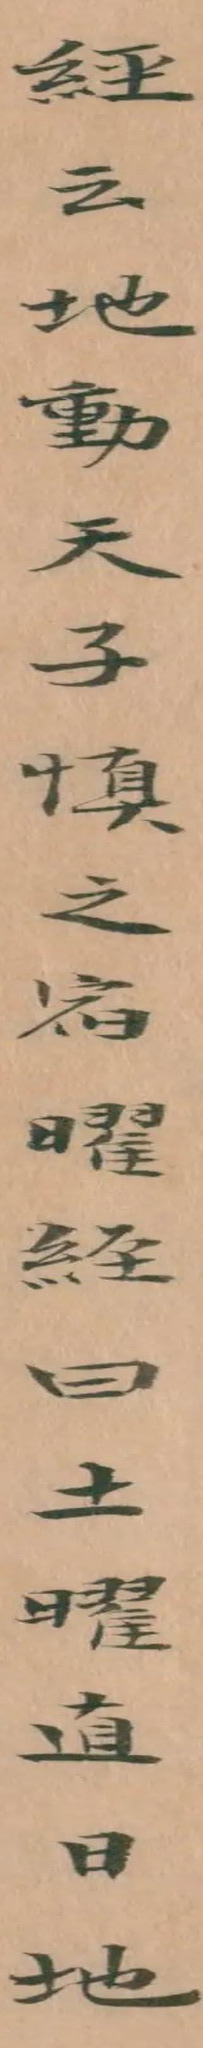経云地動天子慎之宿曜経曰土曜直日地
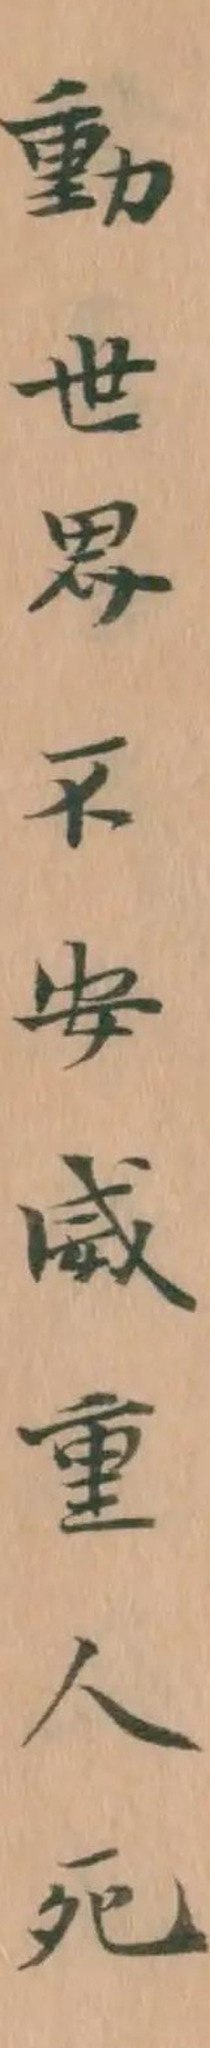動世界不安威重人死
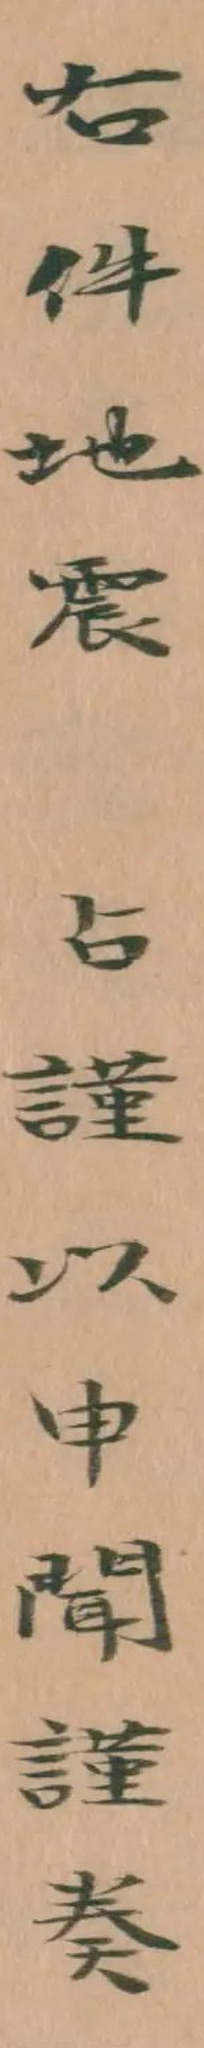右件地震占謹以申聞謹奏
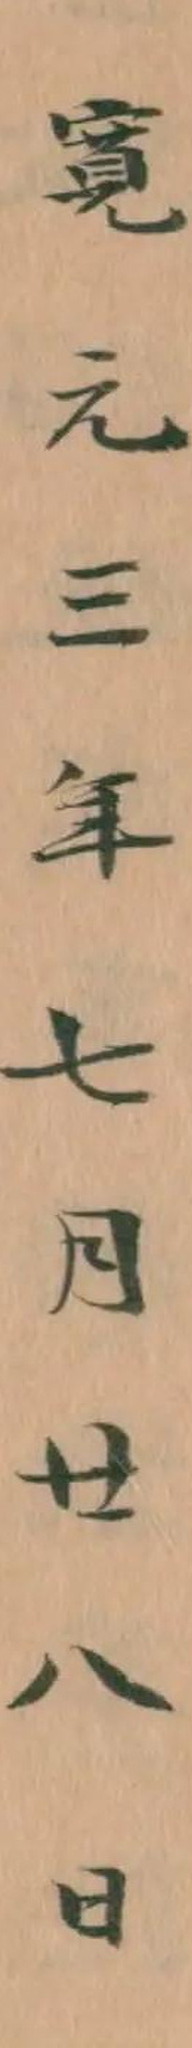寛元三年七月廿八日
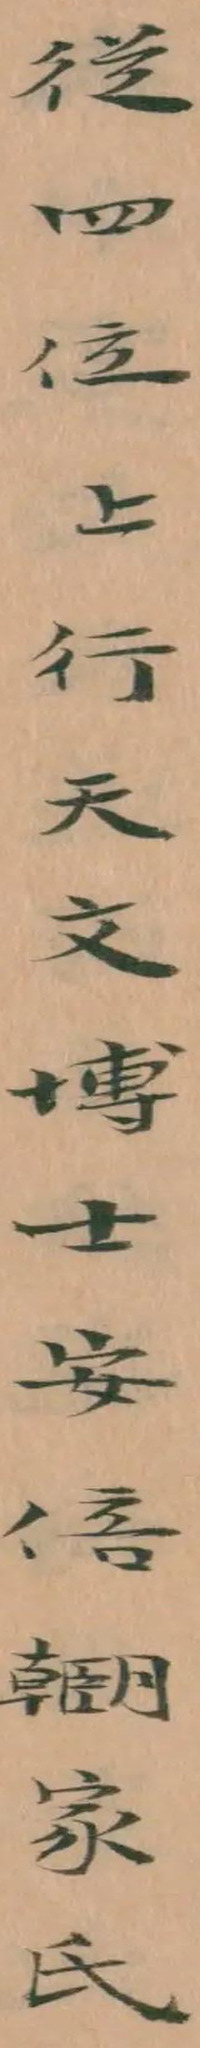従四位上行天文博士安倍朝臣家氏
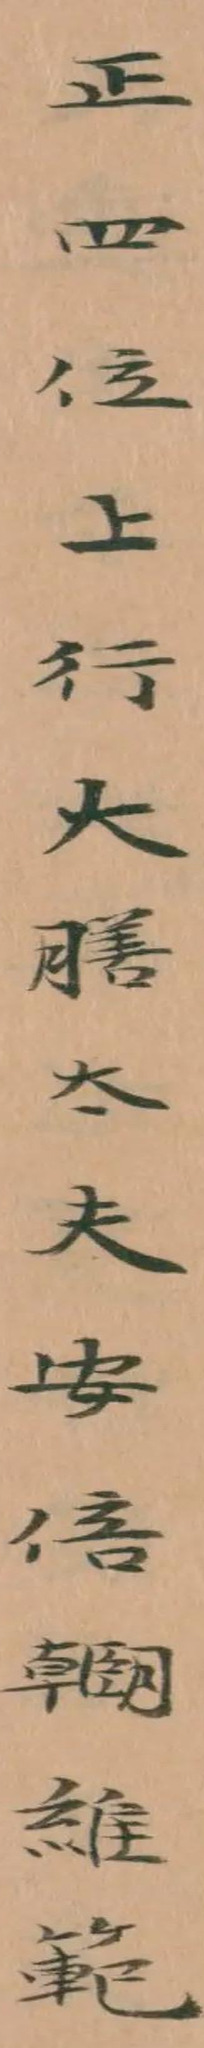正四位上行大膳太夫安倍朝臣維範
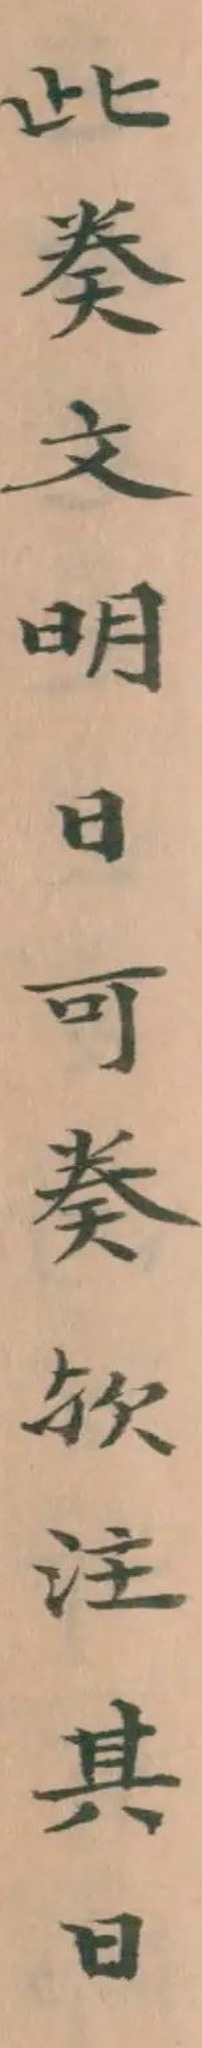此奏文明日可奏歟注其日
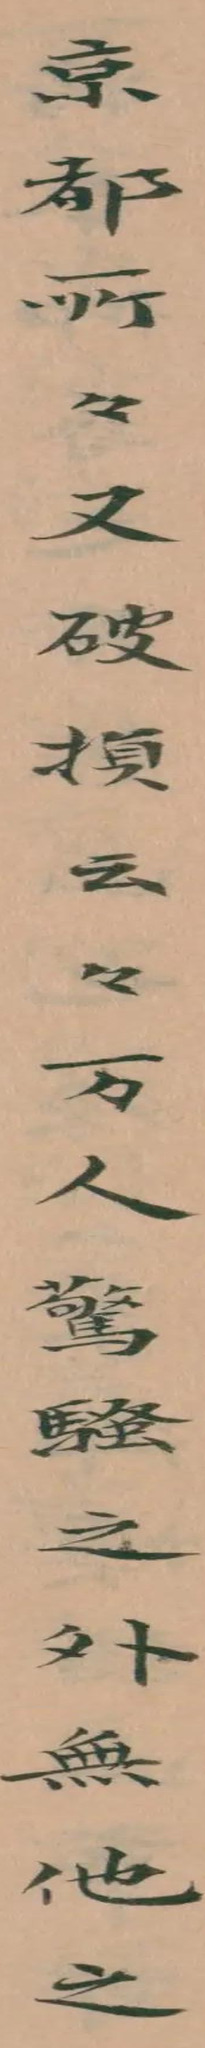京都所々又破損云々万人驚騒之外無他之
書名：地災撮要. 巻5-6(地震之部)
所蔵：国立国会図書館 National Diet Library, JAPAN
